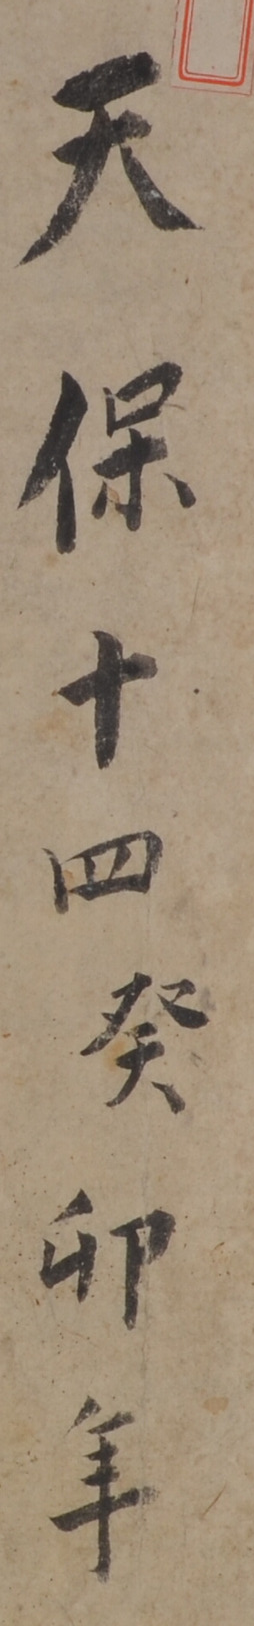天保十四癸卯年
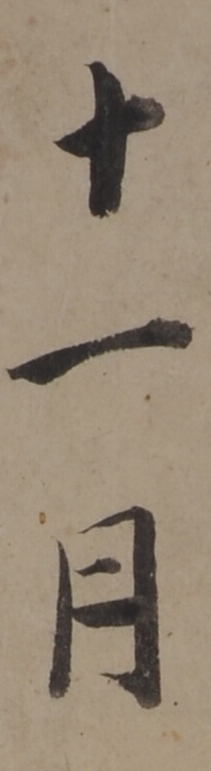十一月

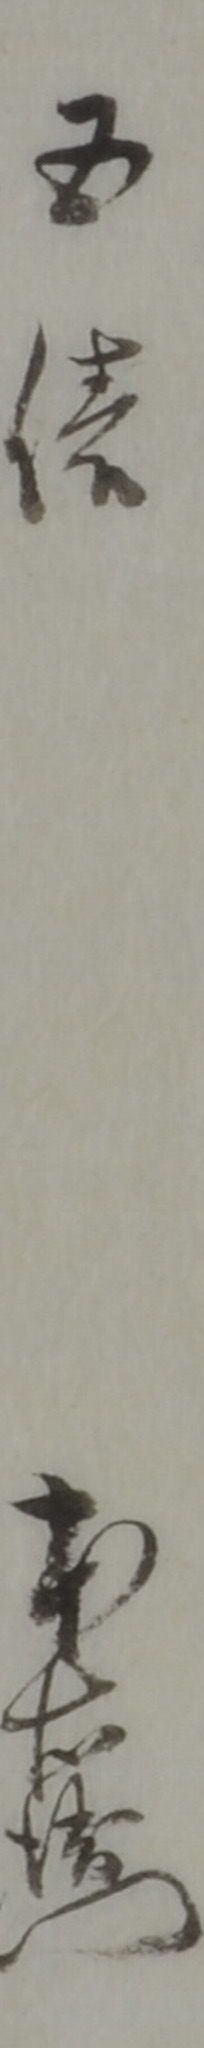五俵本右衛門
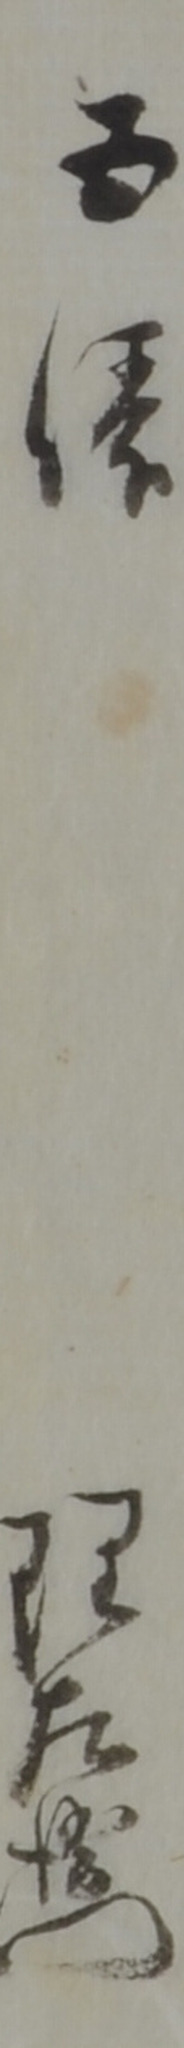五俵理左衛門
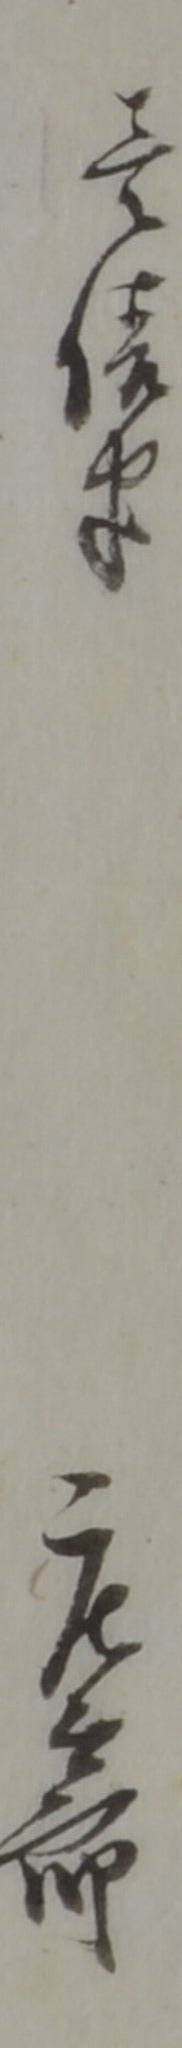壱俵半庄太郎
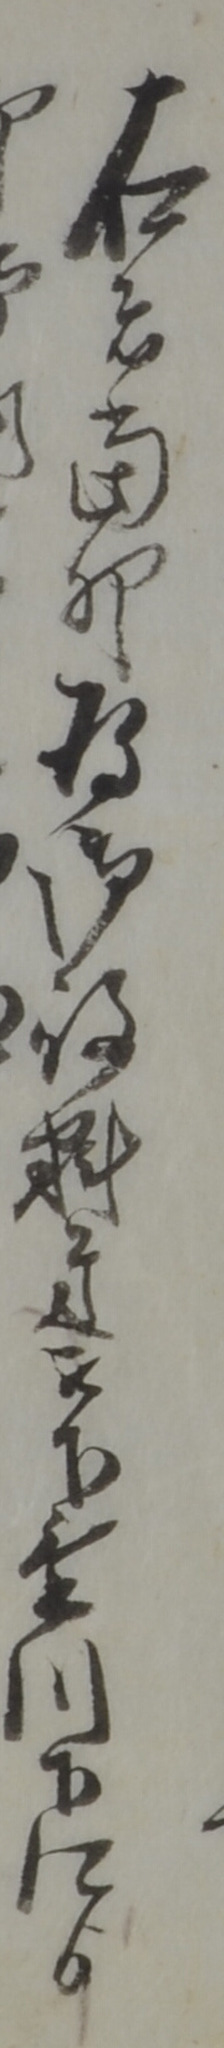右者当卯為御役料米被下置川下郷ゟ
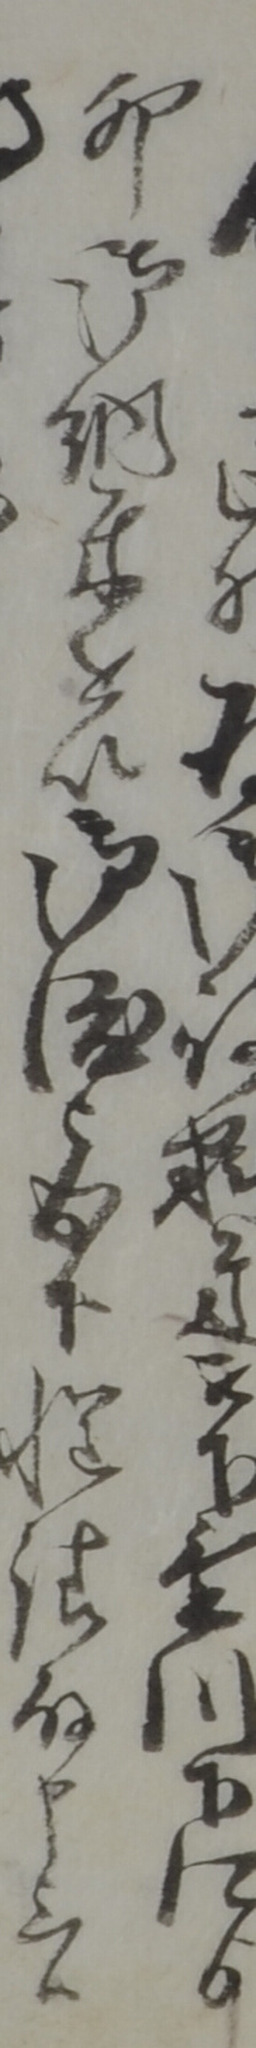卯御納米を以御渡被成下慥請取申上候
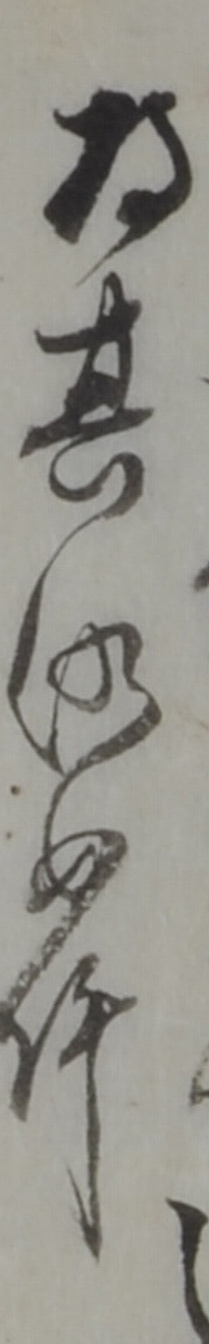為其仍如件
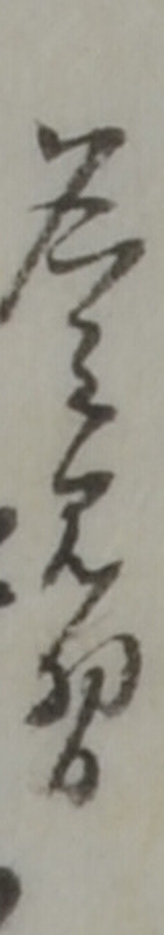名主見習
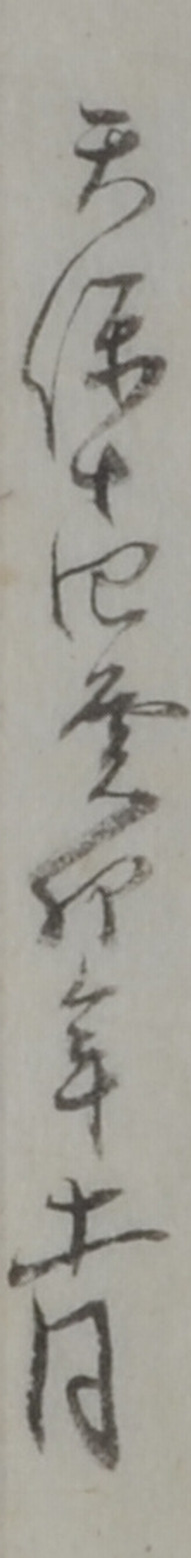天保十四年癸卯年十一月
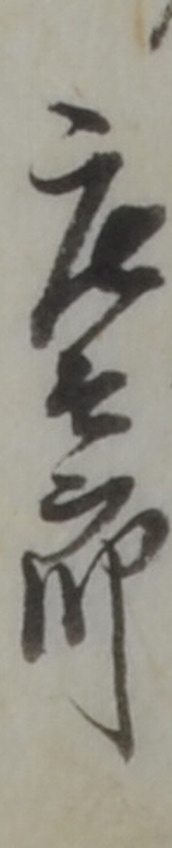庄太郎

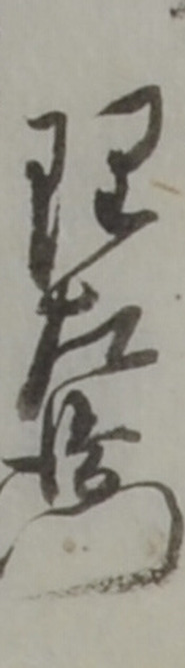理左衛門
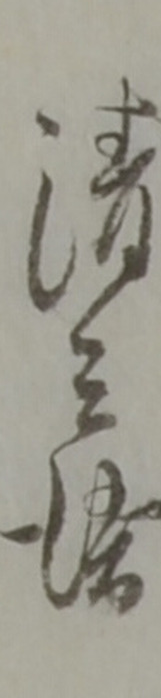清兵衛
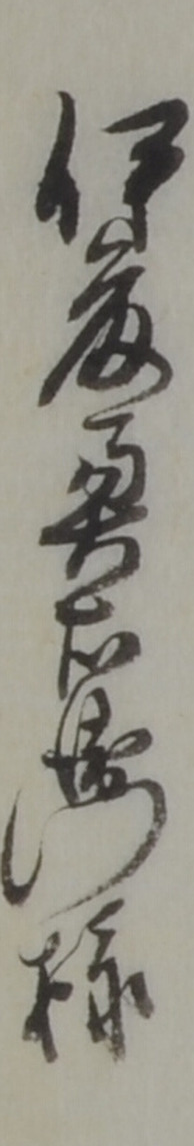伊藤奥右衛門様
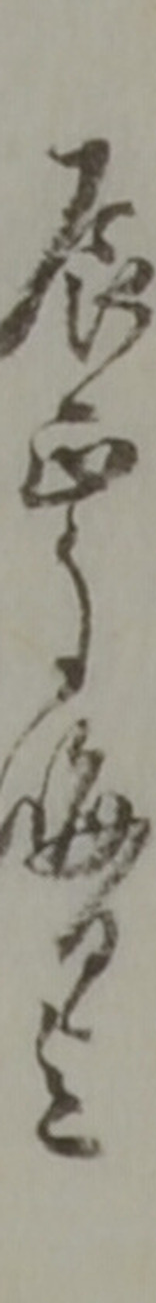辰正月晦日迄
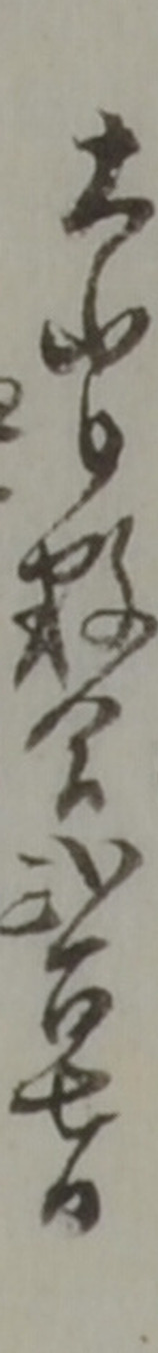大小日数合弐百七日
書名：諸願書控簿
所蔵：伊那市立高遠町図書館・合同会社AMANE
